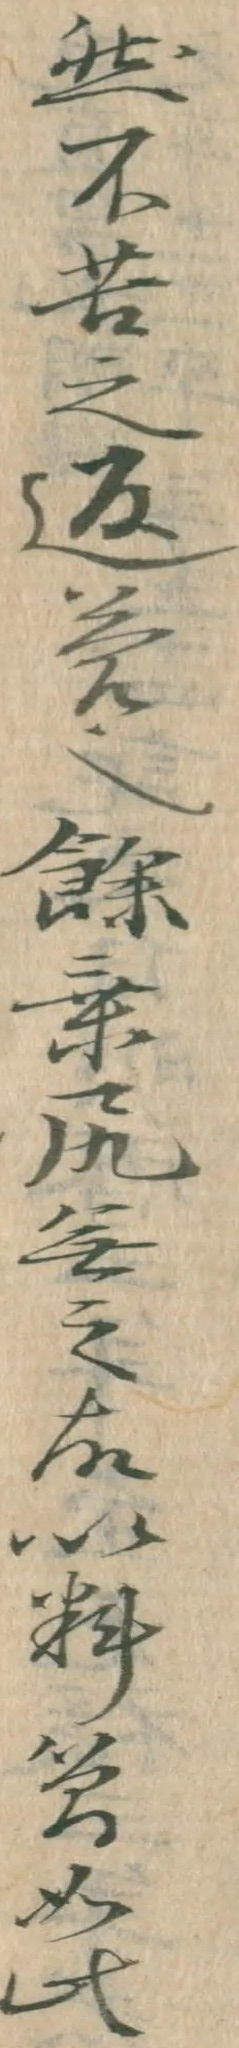然不苦之返答也余乗尻無之故以料簡如此
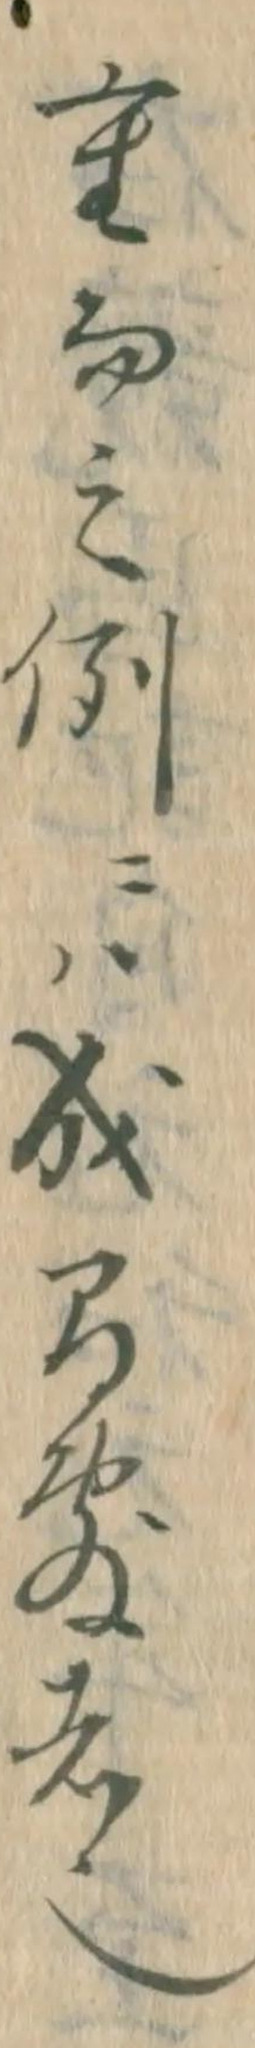重而之例ニハ成間敷者也

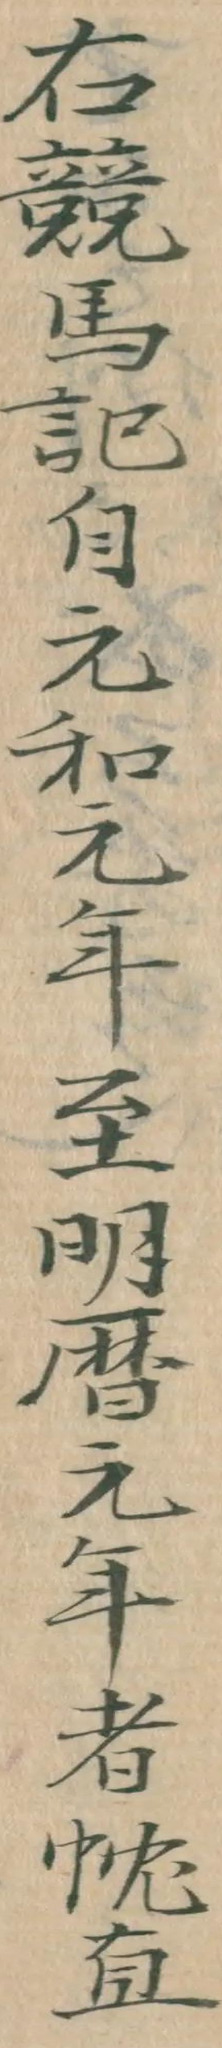右競馬記自元和元年至明暦元年者忱直
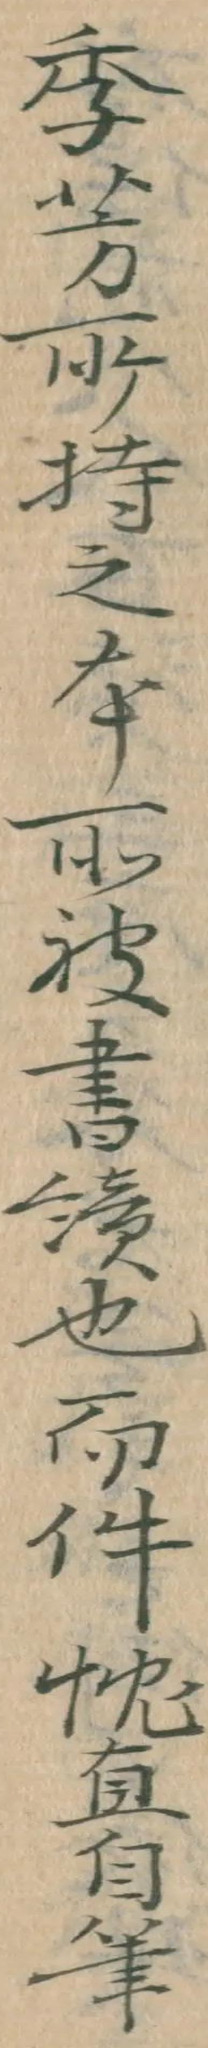季芳所持之本所被書続也而件忱直自筆
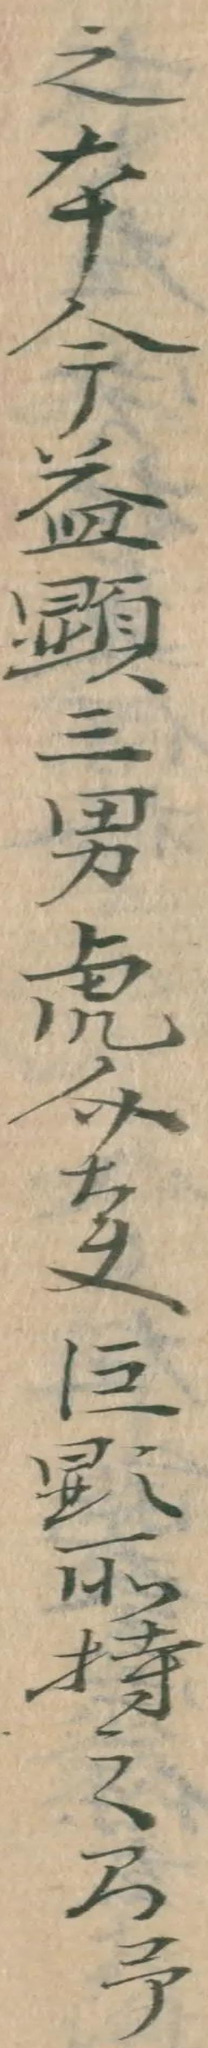之本今益顕三男虎介大夫巨顕所持之間予
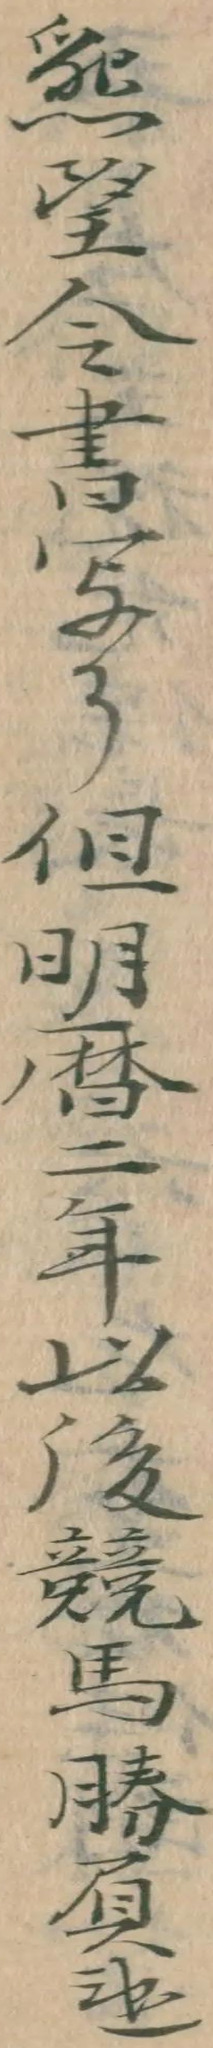懇望令書写了但明暦二年以後競馬勝負違
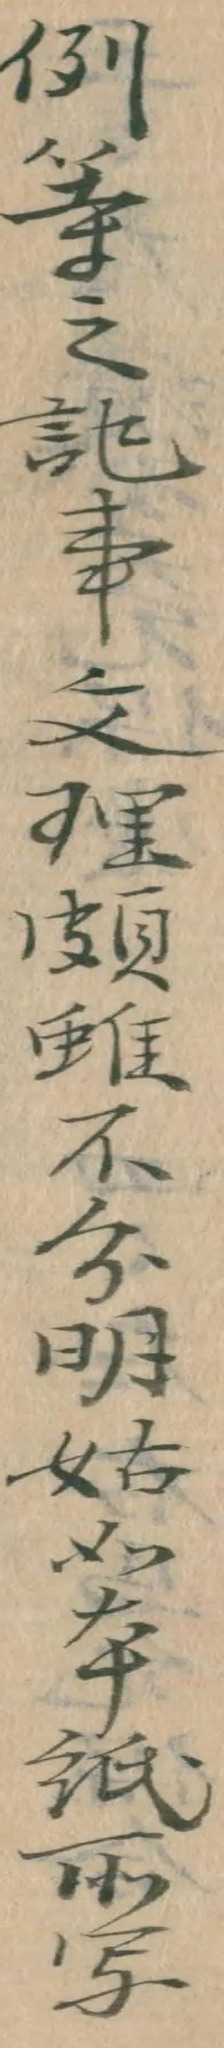例等之記事文理頗雖不分明姑如本紙所写

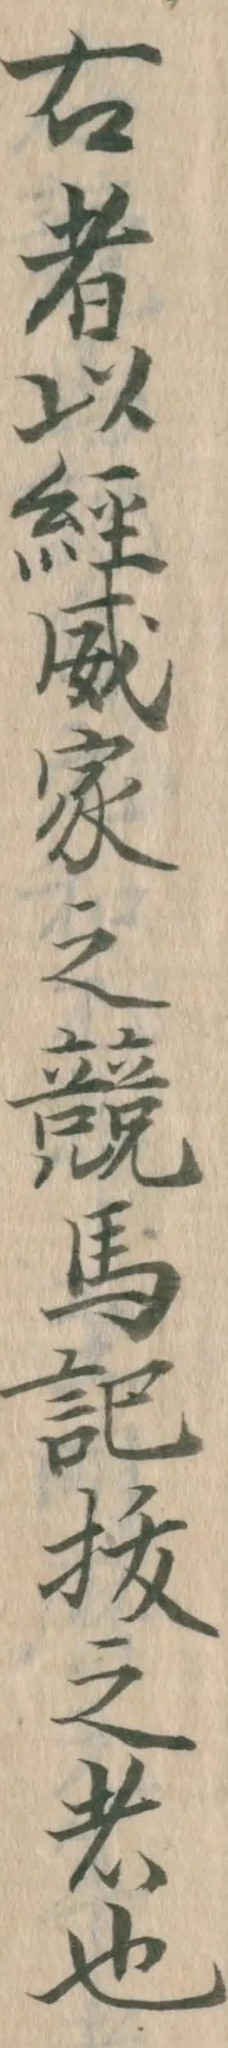右者以経威家之競馬記抜之者也
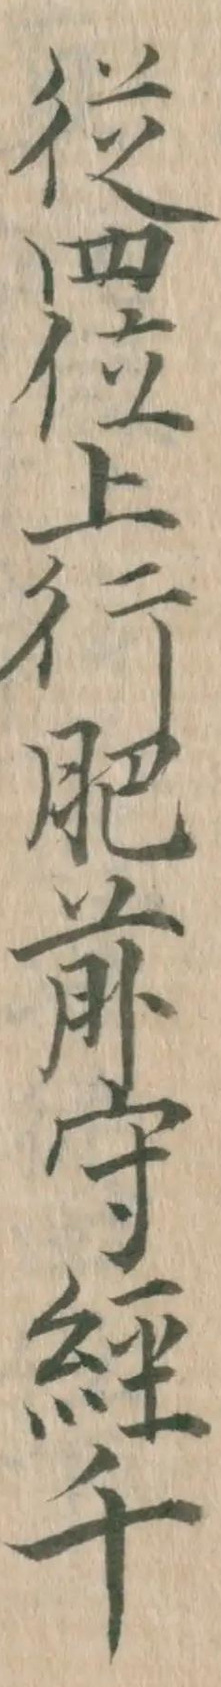従四位上行肥前守経千

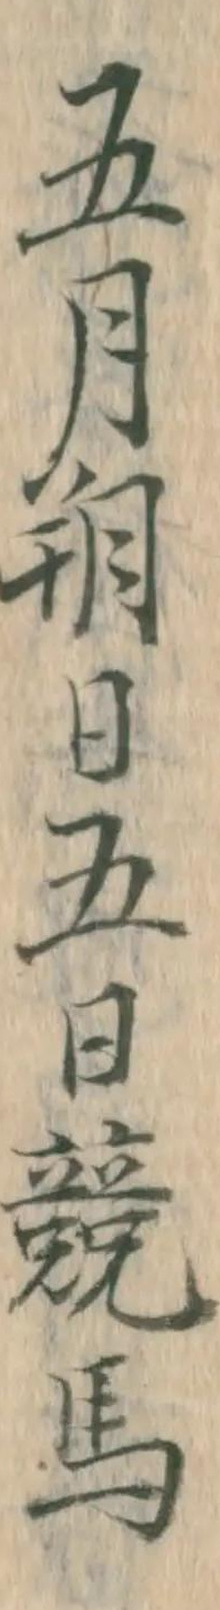五月朔日五日競馬
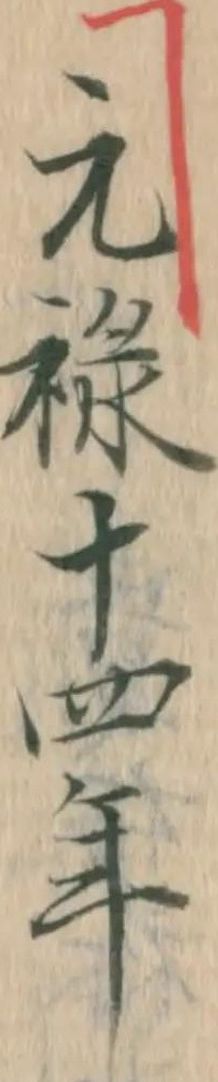元禄十四年
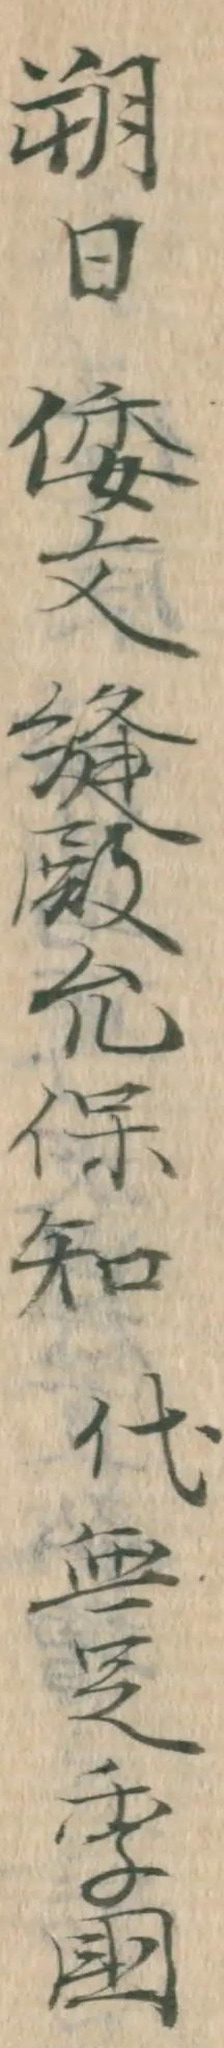朔日倭文縫殿允保知代無足季国
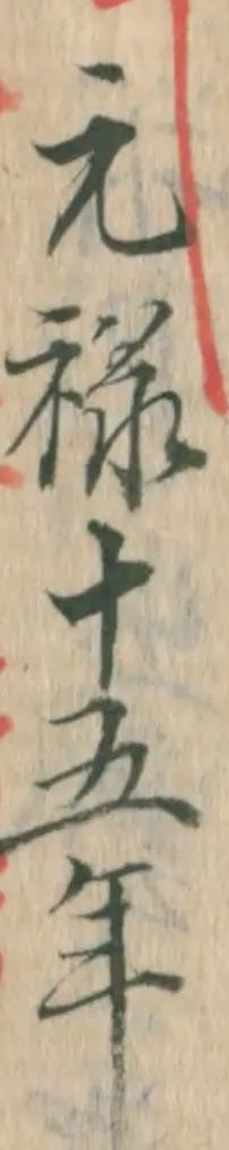元禄十五年
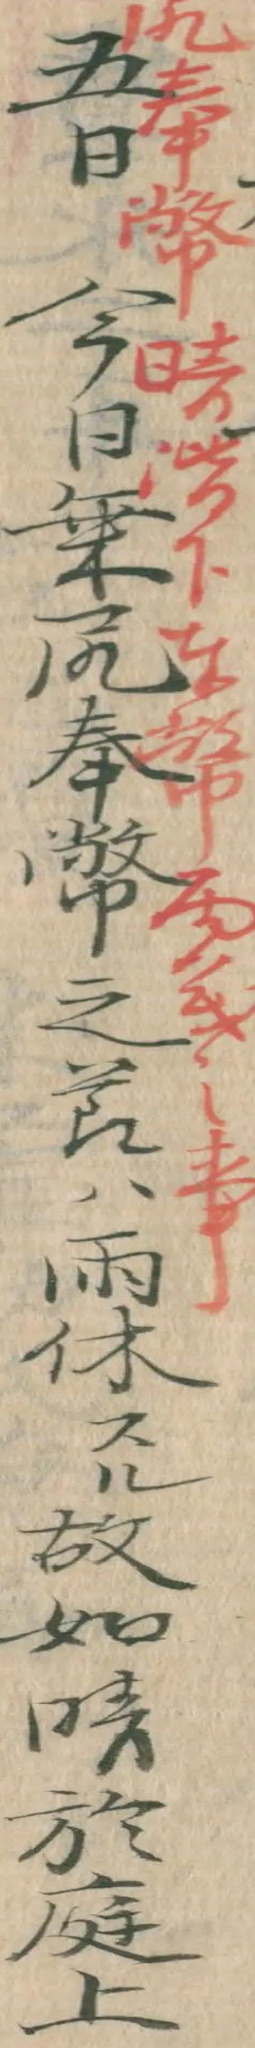五日今日乗尻奉幣之節ハ雨休スル故如晴於庭上
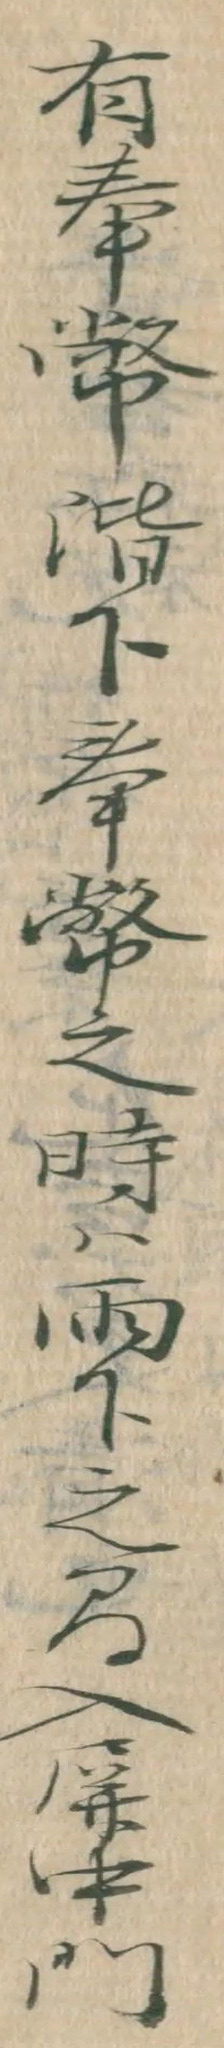有奉幣階下奉幣之時ハ雨下之間入屏中門
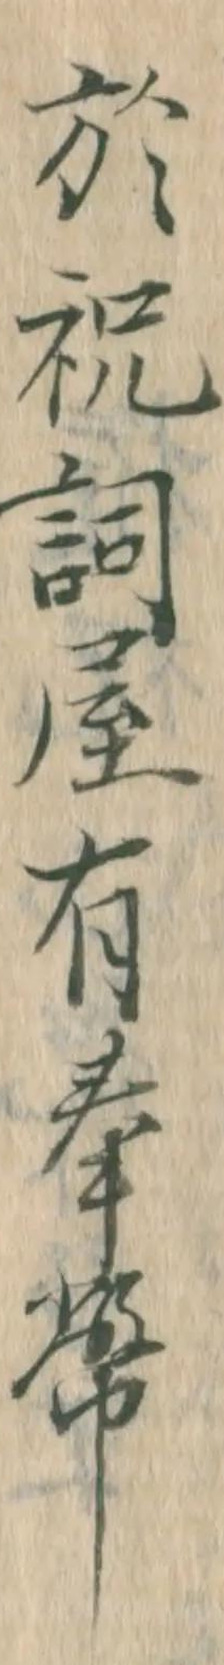於祝詞屋有奉幣
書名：賀茂社記録. 第10冊
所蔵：国立国会図書館 National Diet Library, JAPAN
